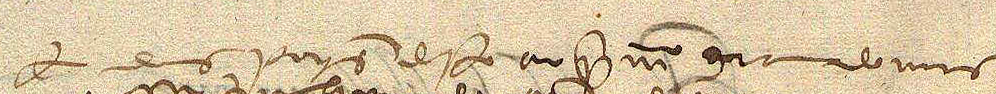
E despoys desto ao p̄mro dia do mes
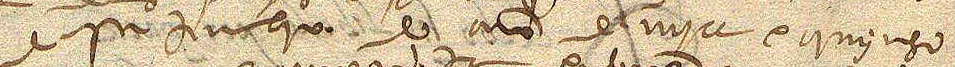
de setenbro do anō de mjll e quynhē
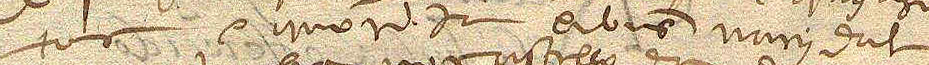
tos e quorēta e dous na cydade
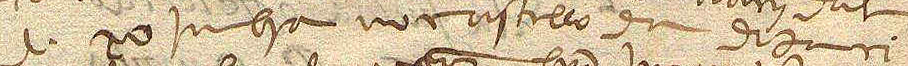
de coJnbra no castello da dita ci
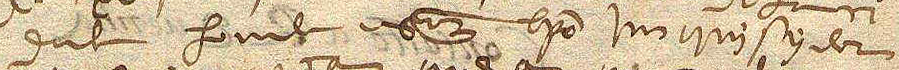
dade honde o sōr bpō Jmqujsydor
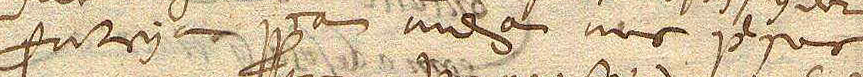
fazya ꝓpca audja aos p̄sos
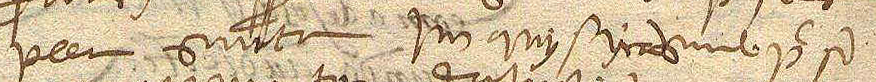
plla sancta Jmquysyçā sendo p̄sē
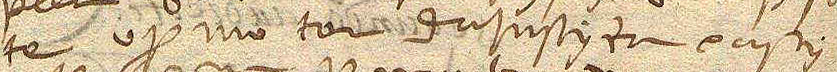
te o ꝓmotor da Justyça e asy
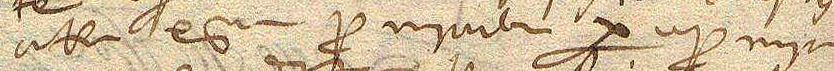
a Re e seu ꝓcurador ꝑ o ꝓcura
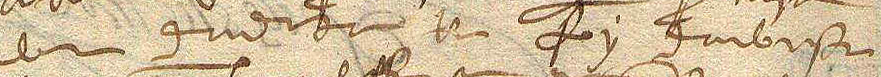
dor da dita Re foy dado este
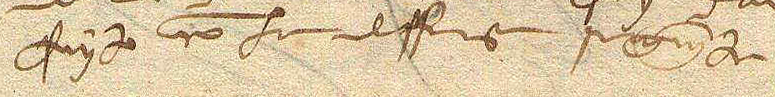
feyto c̄o ha deffesa seguj̄te
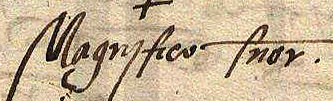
Magnjfico snor̄.
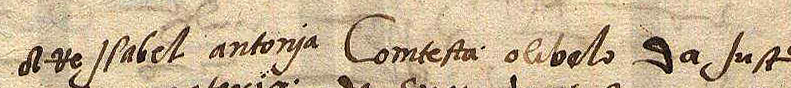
A Re Jsabel antonja Comtesta o libelo da Justa
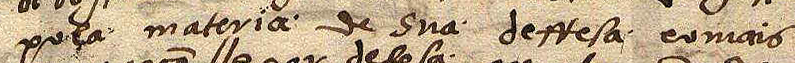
pola materia de sua deffesa. e o mais
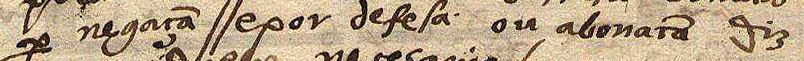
ꝑ negaçā // e por defesa. ou abonaçā diz
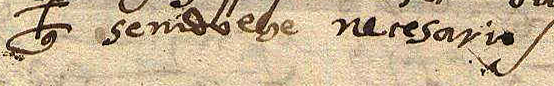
q̄ sendolhe necesario /
